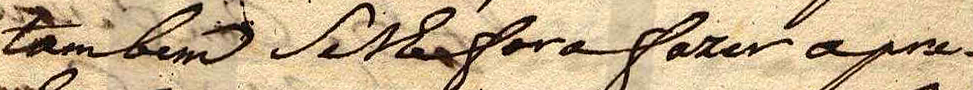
tambem se lhe fora fazer apre
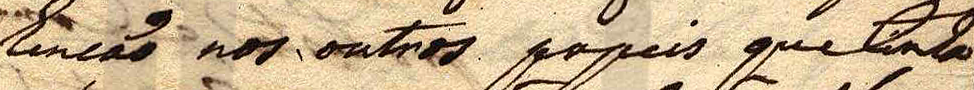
hençaõ nos outros papeis que tinha
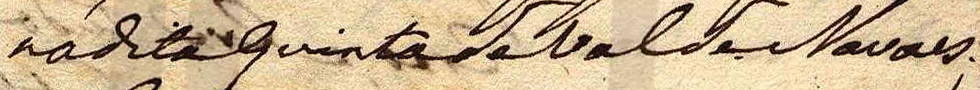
na dita quinta de val de Navaes;
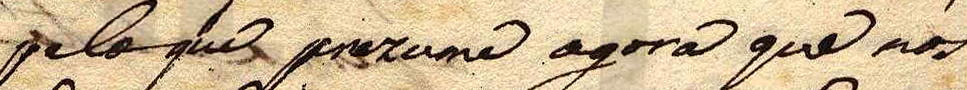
pelo que prezume agora que nos
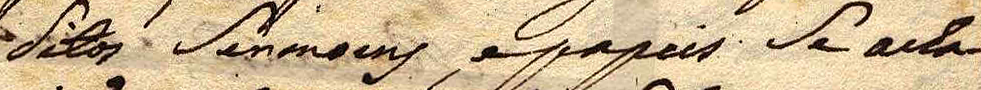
ditos Sermoens, e papeis se acha
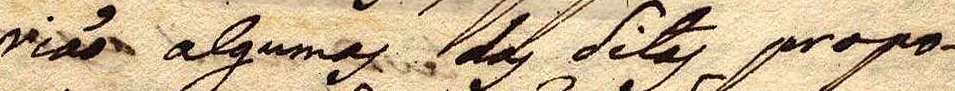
riaõ algumas das ditas propo
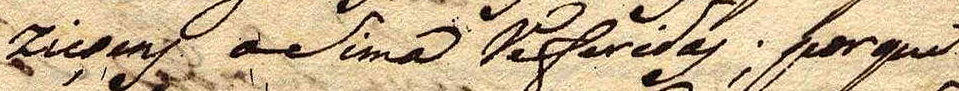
ziçoens aSima Referidas; porque
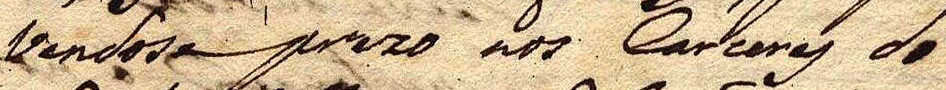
vendose prezo nos Carceres do
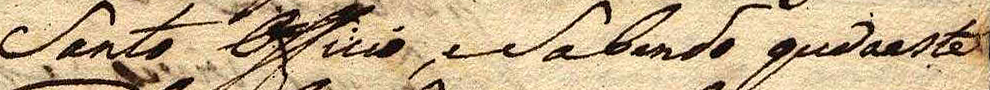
Santo Officio, e Sabendo que a este
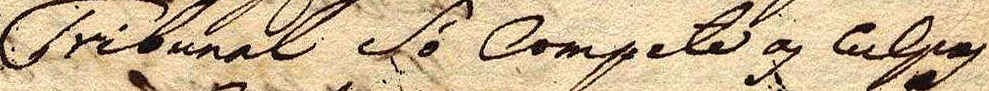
Tribunal Só Compete as Culpas
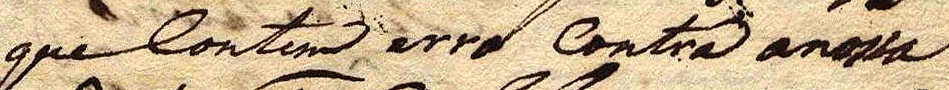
que Contem erro contra a nossa
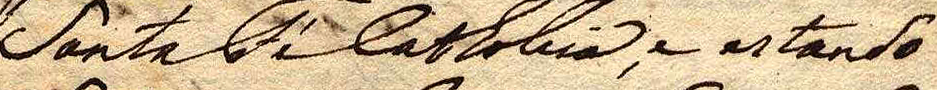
Santa Fé Catholica, e estando
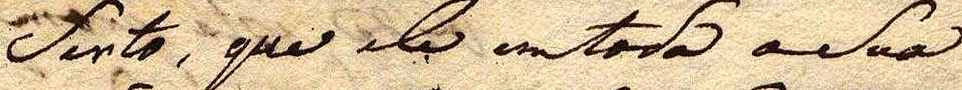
Serto, que ele em toda a Sua
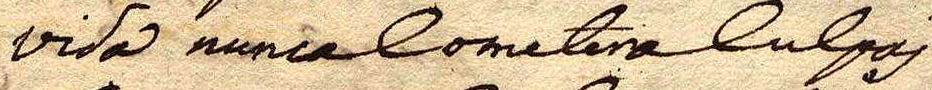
vida nunca Cometera Culpas
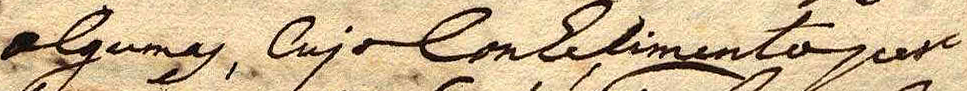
algumas, Cujo Conheçimento per
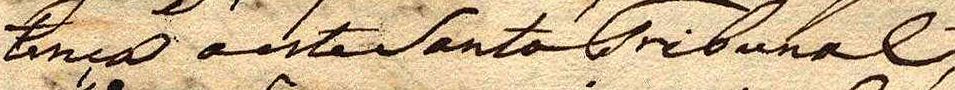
tença a este Santo Tribunal,
